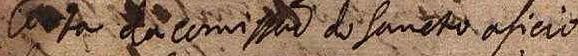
Carta da comissaõ do Sancto ofiçio
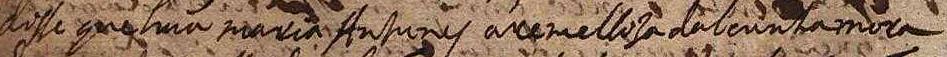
disse que huā maria Antunes a remelloza dalcunha mora
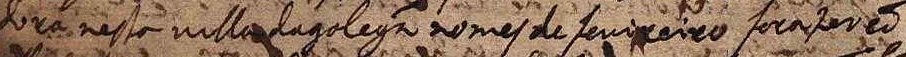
dora nesta uilla da golegã no mes de fevereiro fora ter cō
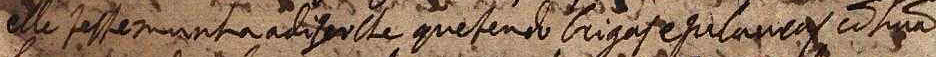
elle testemunha a dizerlhe que tendo brigas e palauras cō huā
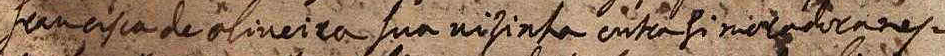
francisca de oliveira sua vizinha outrasi moradora nes
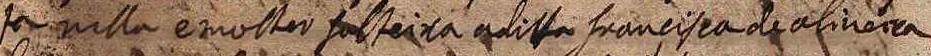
ta villa e molher solteira a ditta françisca de oliueira
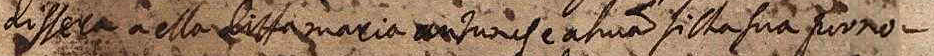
dissera a ella ditta maria antunes e a huā filha sua por no
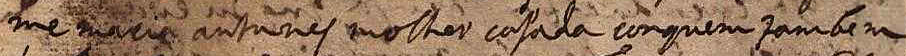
me maria antunes molher casada con quem tambem
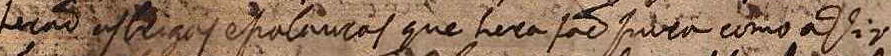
tirão as brigas e palauras que hera taõ pura como a Vir
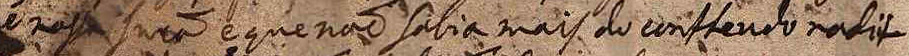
gē nossa Snrā e que naõ sabia mais do contheudo na dit
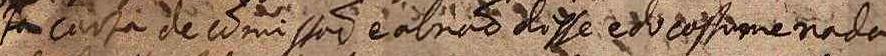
ta carta de comissaõ e al naõ disse e do costume nada
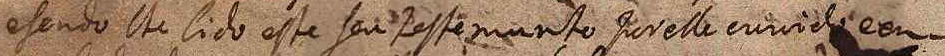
e sendo lhe lido este seu testemunho por elle ouuido e en
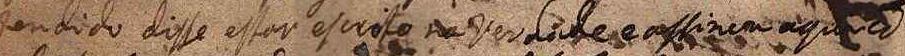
tendido disse estar escrito na Verdade e assinou aqui cō
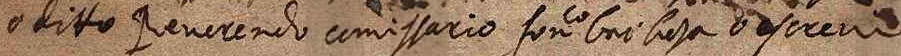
o ditto Reuerendo comissario frnco barboza o escreui
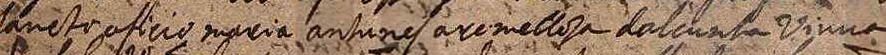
Sancto ofiçio maria antunes a remelloza dalcunha viuua
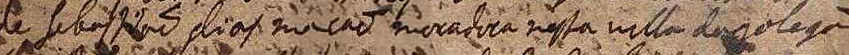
de Sebastiaõ dias maçaõ moradora nesta uilla da golegã
